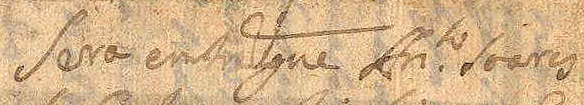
sera emtregue An.to Soares
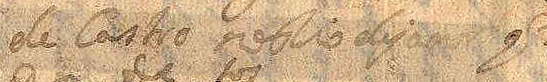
de Castro no Rio de janr q̄
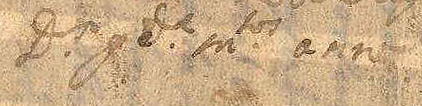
D.s gd.e m.tos annos
